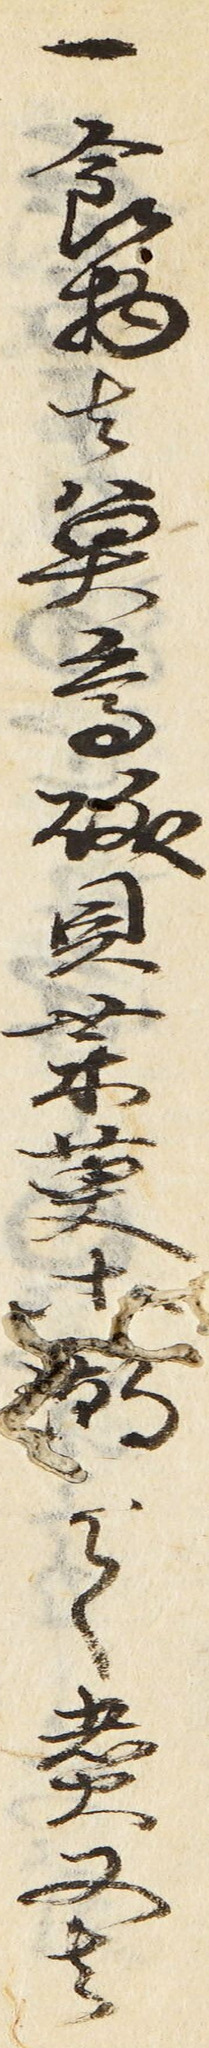一食物者魚鳥磯貝茱萸等潮ニて煮又者
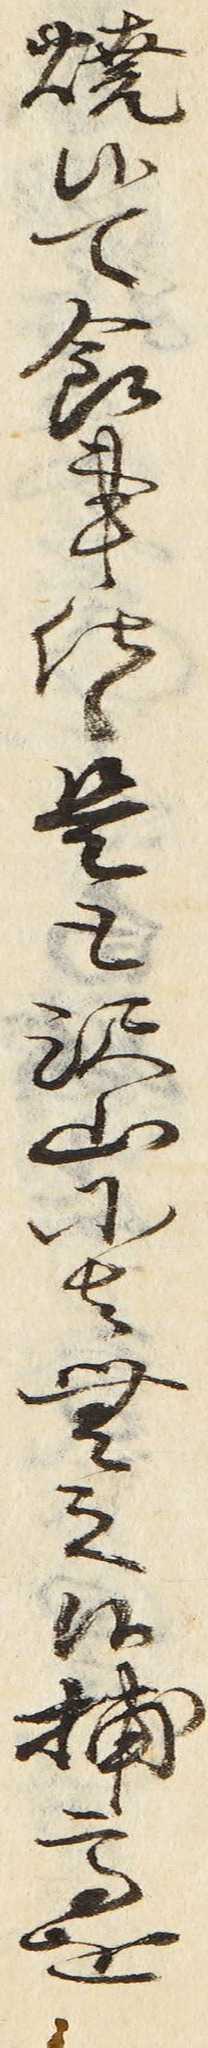焼候て食事仕候是も沢山に者無之候捕高を
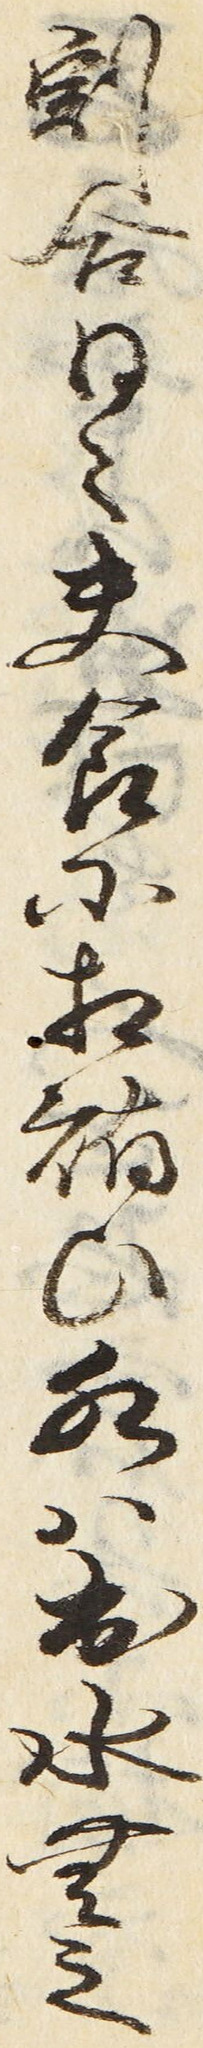割合日々夫食に相賄ひ水ハ出水無之
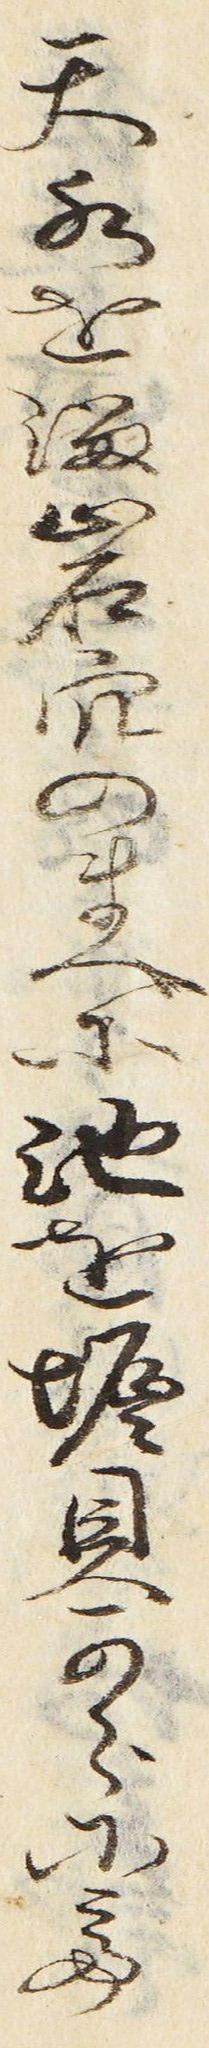天水を溜岩穴のまへに池を堀貝からにて
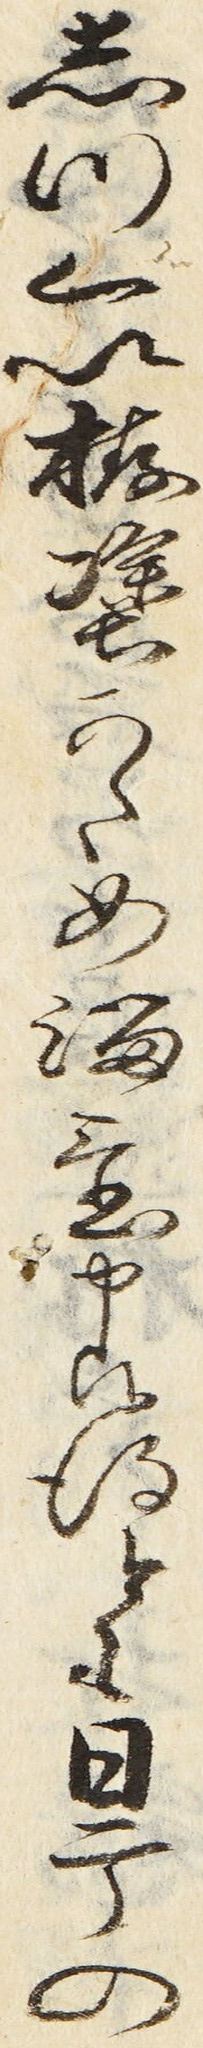しつくい拵塗かため溜置申候得とも日干の
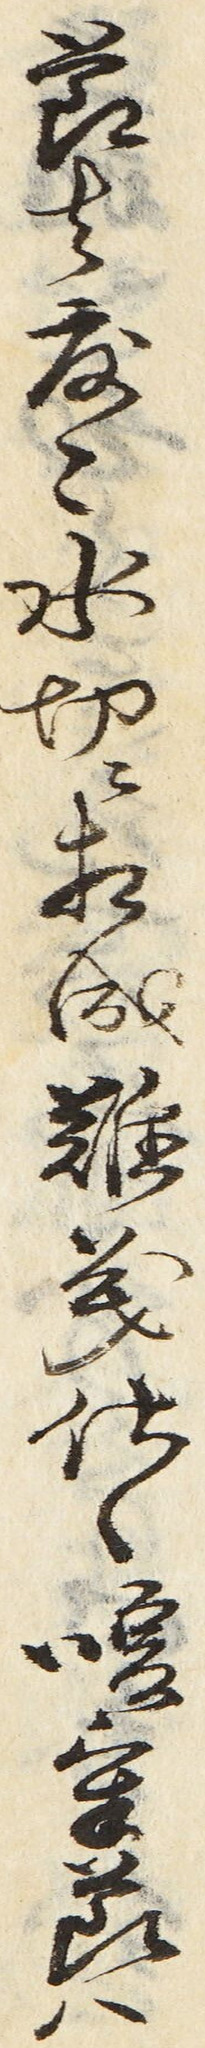節者度々水切ニ相成難義仕候暖気節ハ
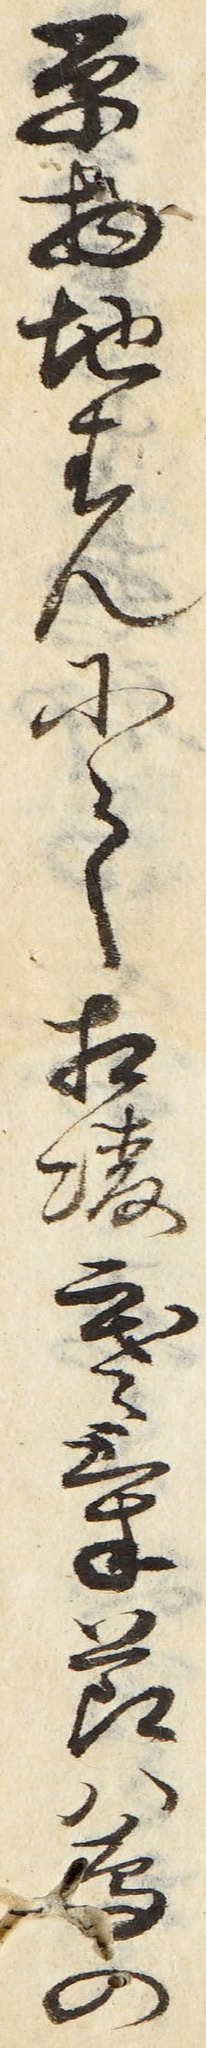単物地はんにて相凌寒気節ハ鳥の
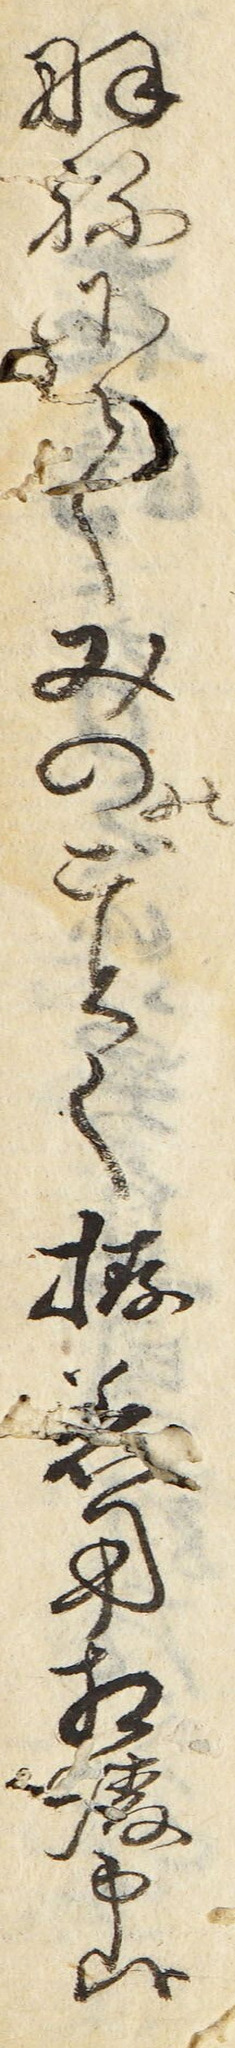羽ねにてみののごとく拵着用相凌申候

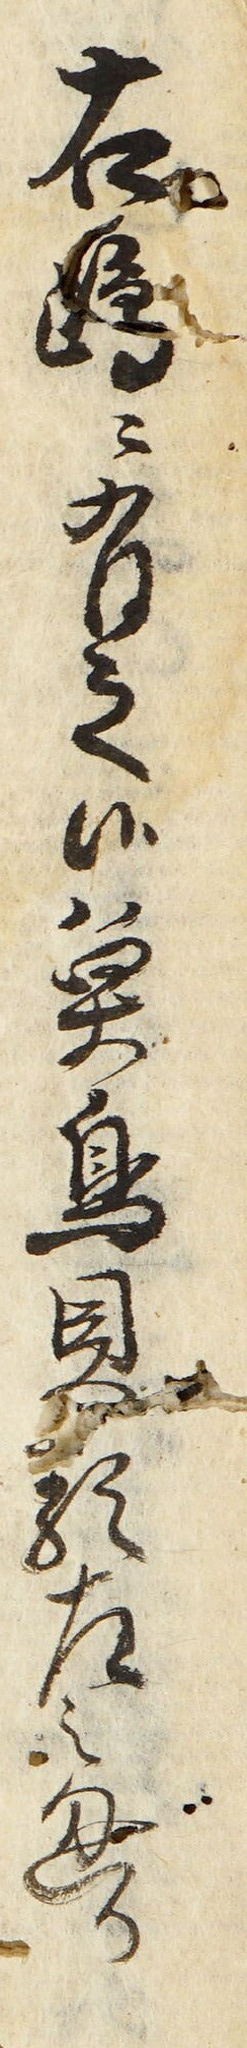右嶋ニ有之候魚鳥貝類左之通り
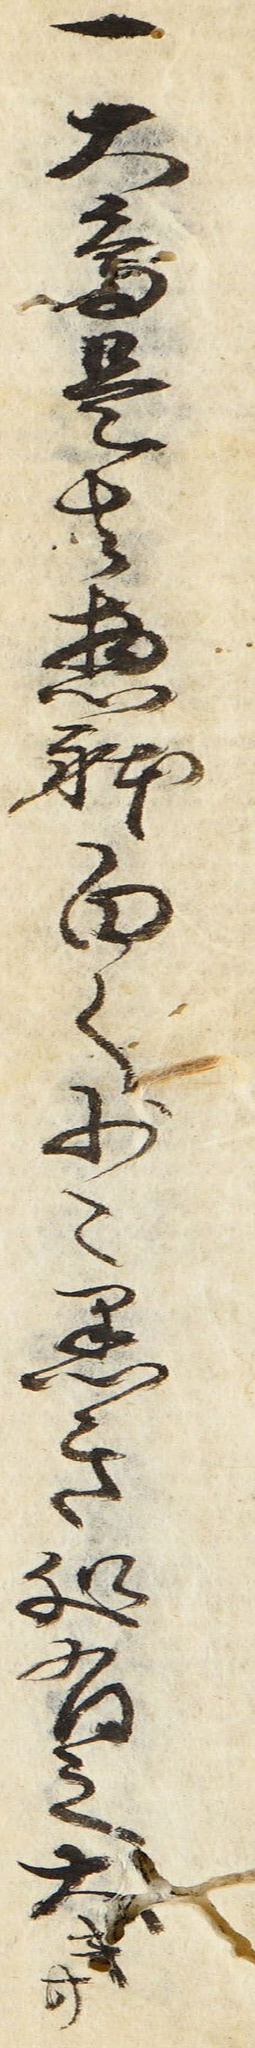一大鳥是者惣体白く少々黒き処有之大キサ
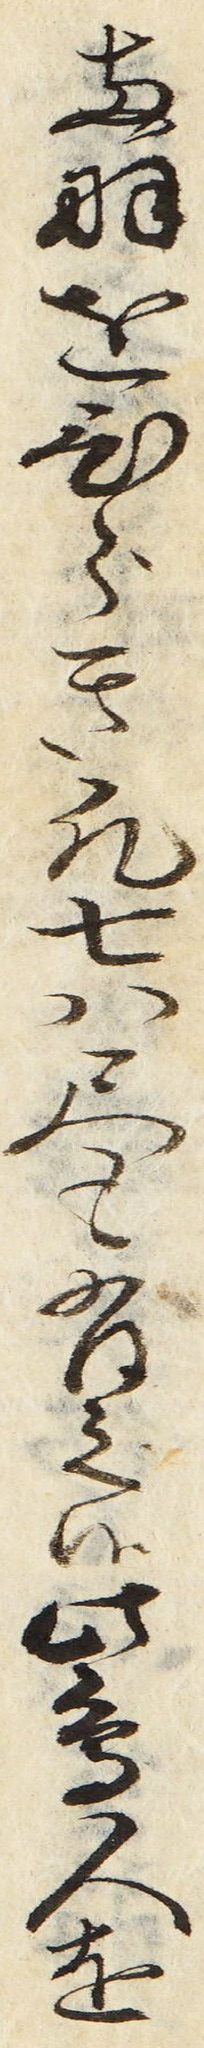両羽をひらき凡七八尺も有之候此鳥人を
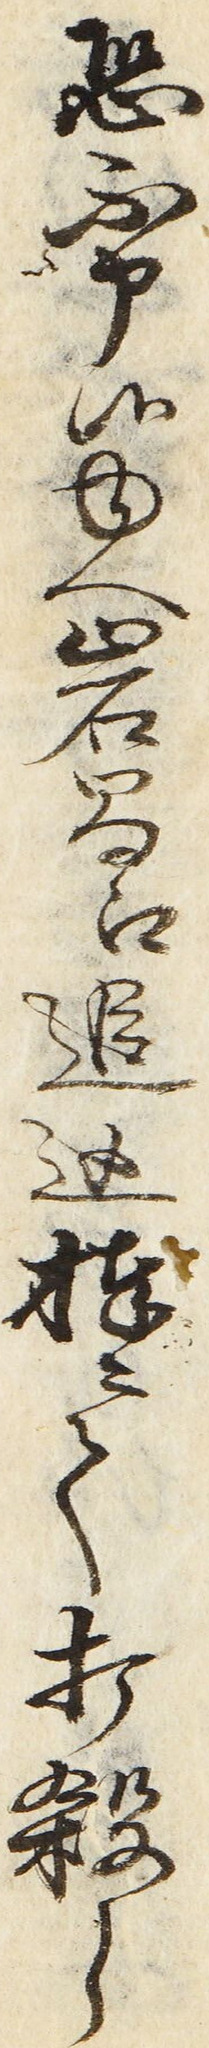恐不申候ゆへ岩間江追込棒ニて打殺し
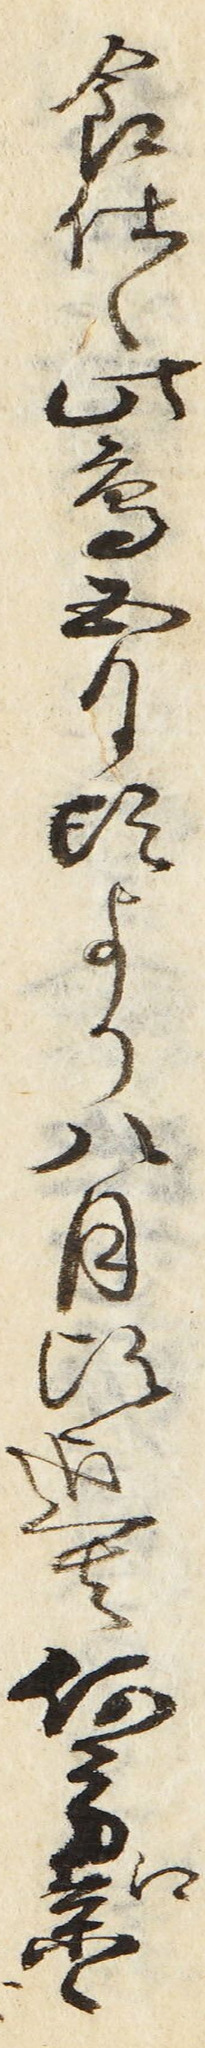食仕候此鳥五月頃より八月頃迄者何方江参候哉
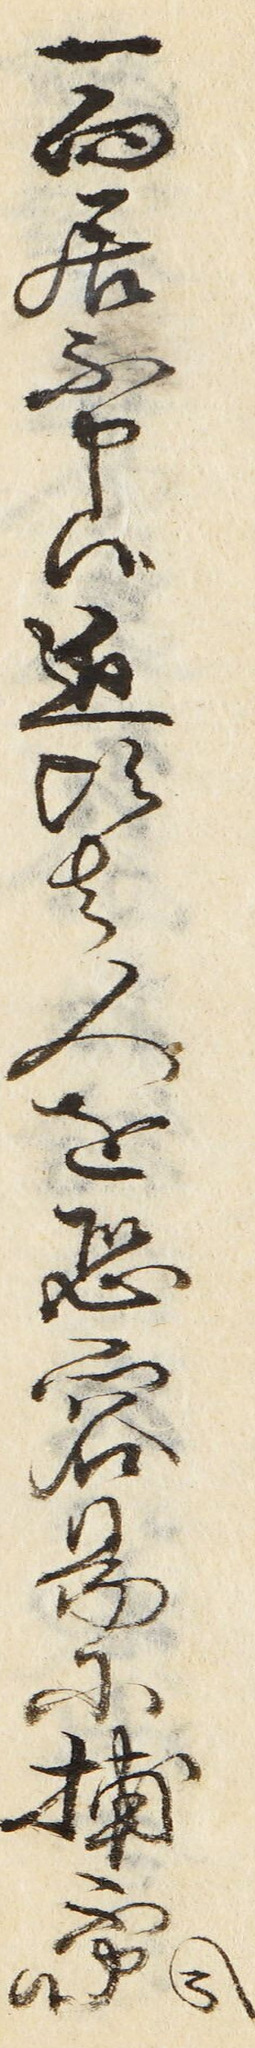一向居不申候近頃者人を恐容易に捕不申候
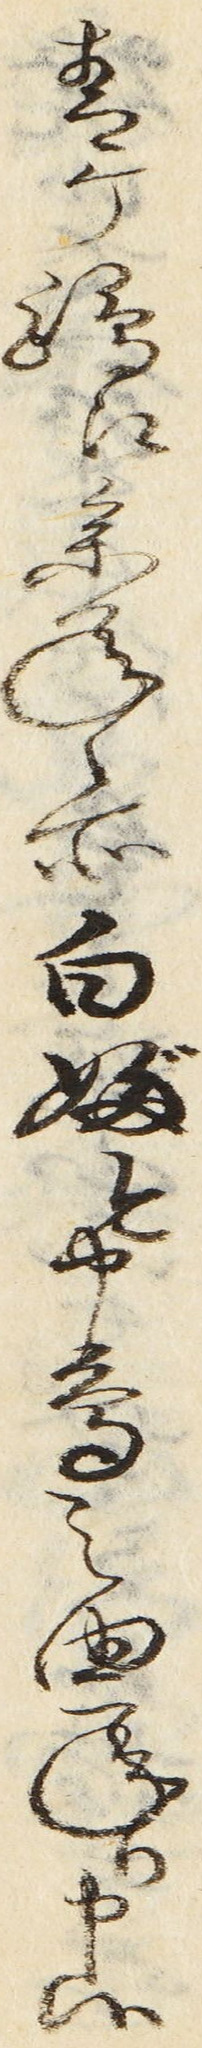青ケ嶋江参承候所白ぶと申鳥之由承り申候
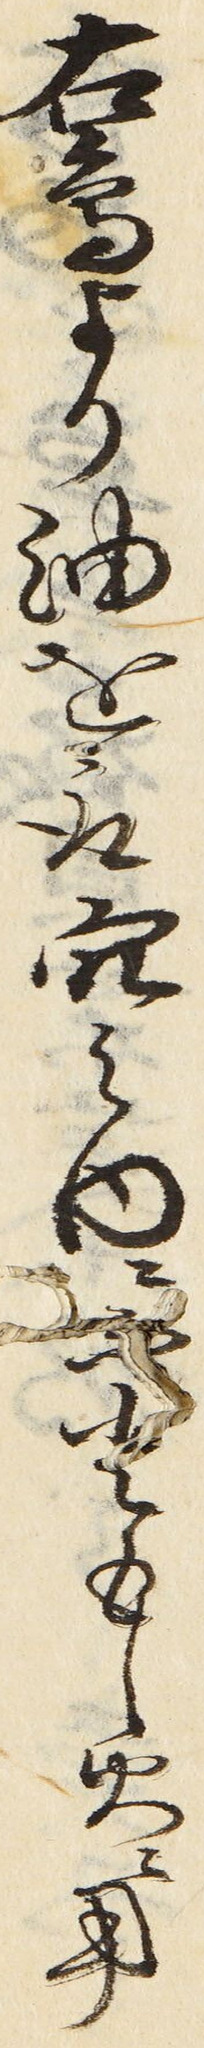右鳥より油を取穴之内ニともし火ニ用
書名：漂流一件上書
